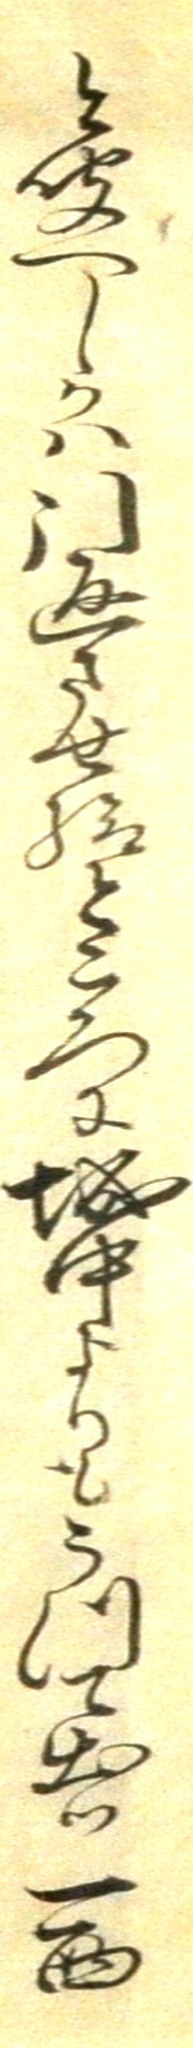と聞へしかは引返させ給ところに城中よりもうつて出ッ一西
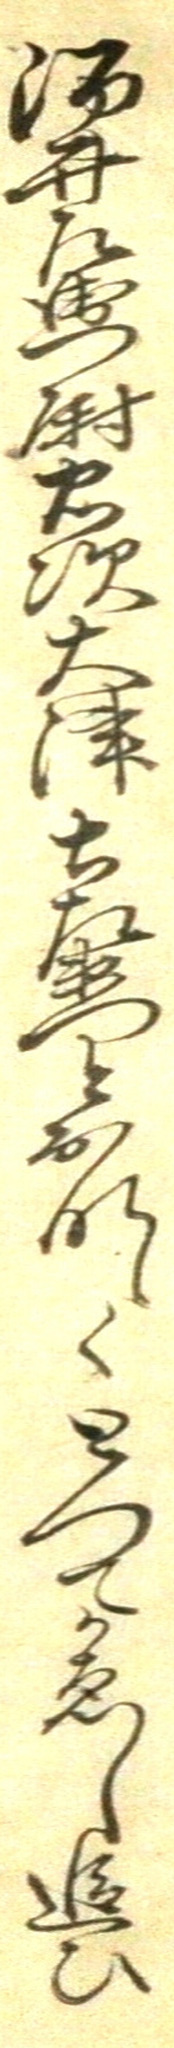酒井左衛門尉忠次大津土左衛門とおなしくとつてかゑし追ひ
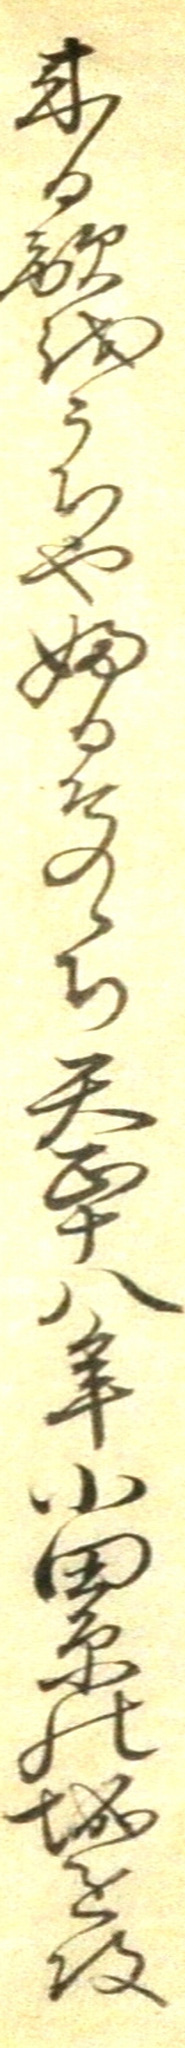来る敵をうちやふるそのゝち天正十八年小田原の城を攻
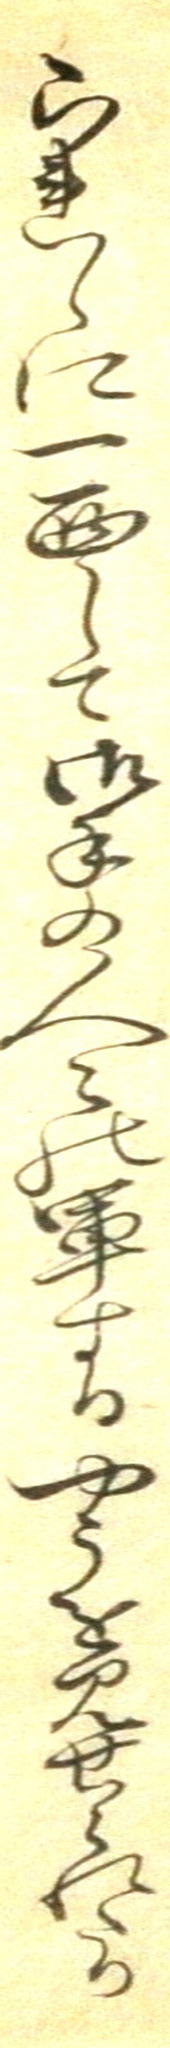られしに一西して御手の人々の軍するやうを見せられたり
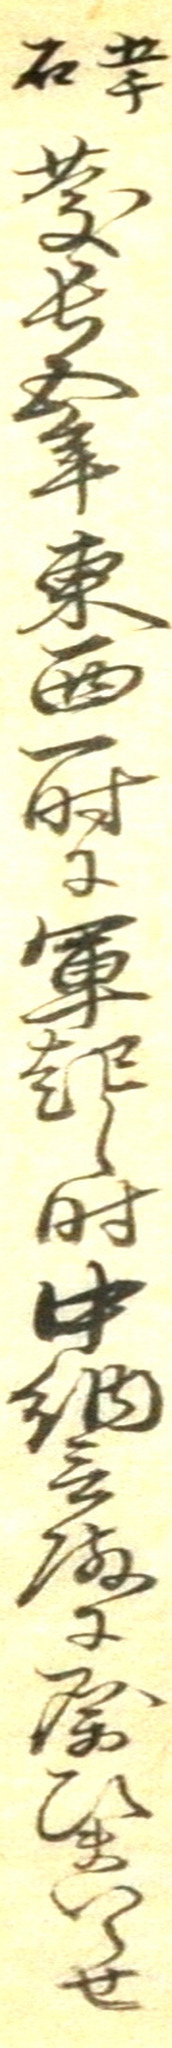五千石慶長五年東西一時に軍起し時中納言殿に属ひまいらせ
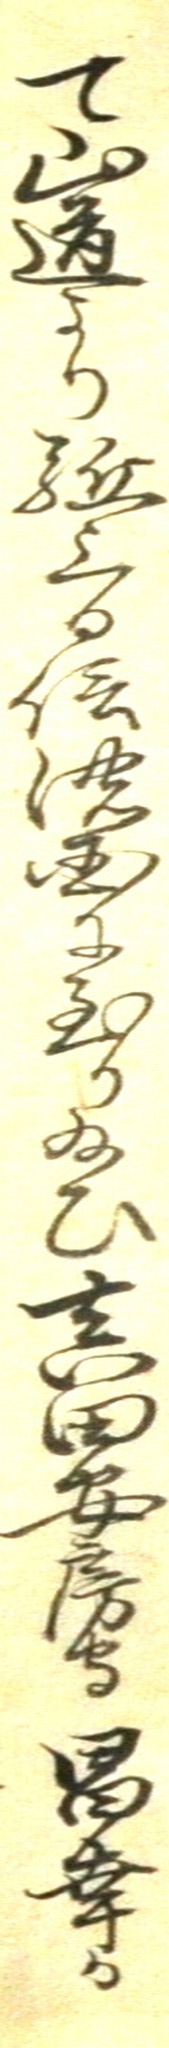て山道より駈上る信濃国に至り給ひ真田安房守昌幸か
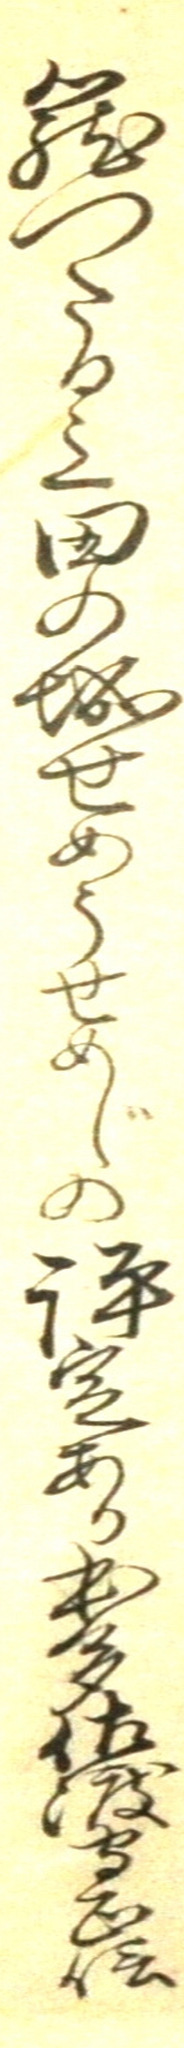籠つたる上田の城せめうせめじの評定あり本多佐渡守正信
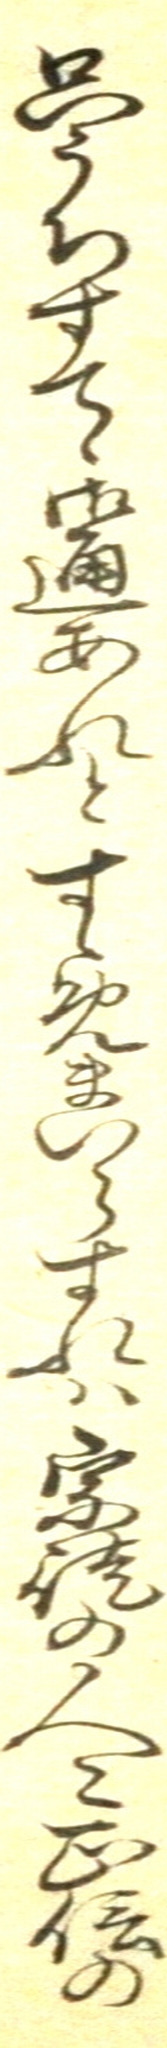只うちすてゝ御通あれとすゝめまいらすれは宗徒の人々正信の
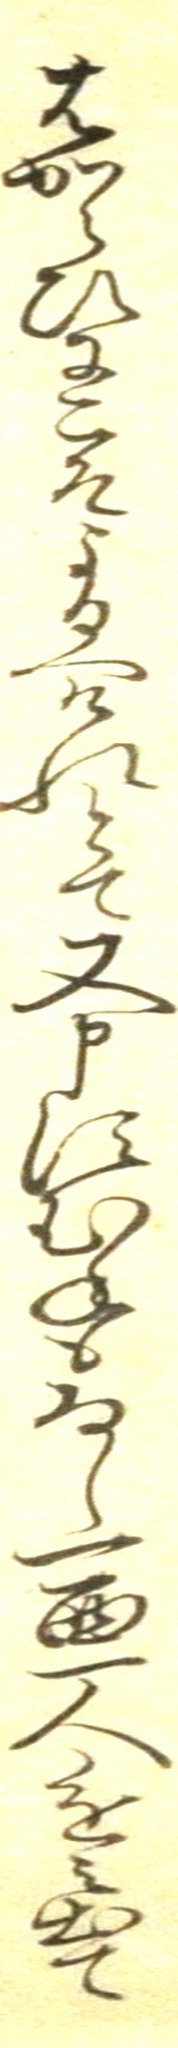はからひにこそよるへけれとて又申すむねもなし一西一人進み出て
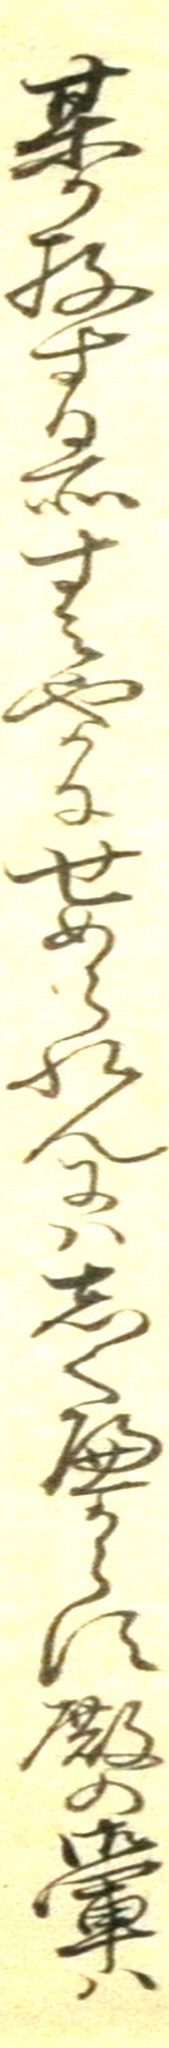某か存する所すみやかにせめられんにはしくへからす殿の御軍は
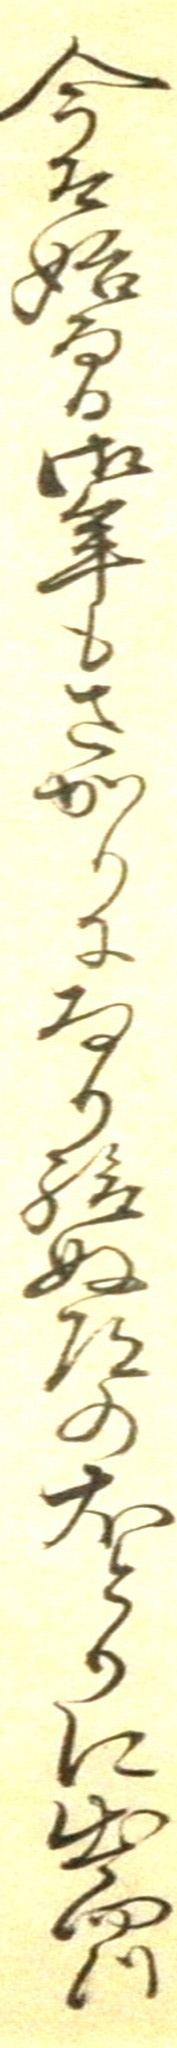今そ始なる御年もさかりになり給ぬ道のほとりに出向つ
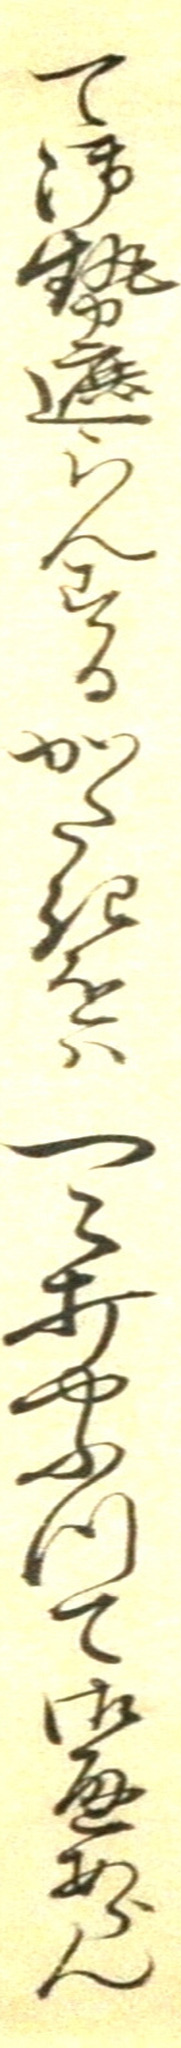て御勢遮らんするかたきをは一々打やふつて御通あらん
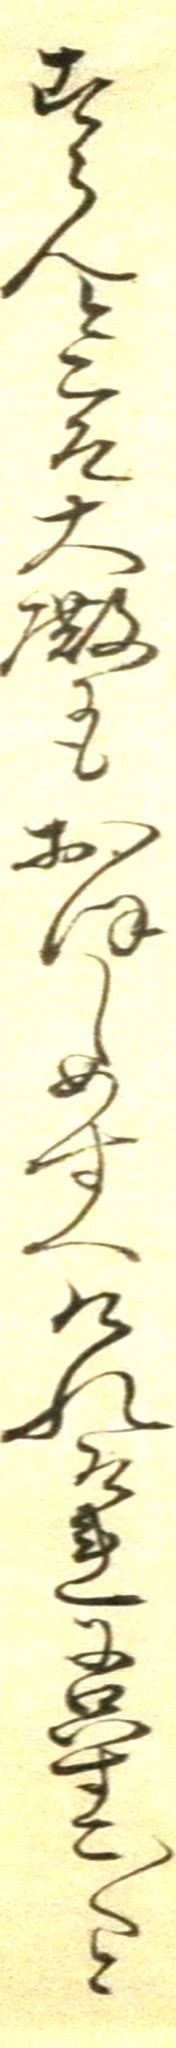すらんとこそ大殿にもおほしめすへけれそれに只すこ〳〵と
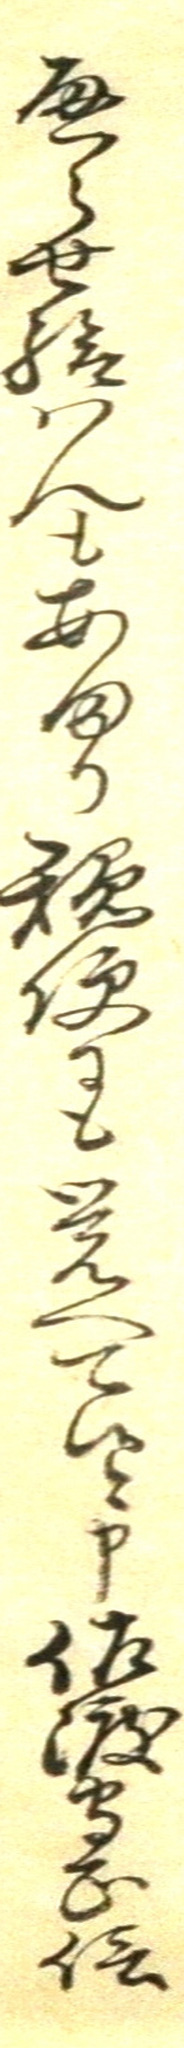通らせ給はんもあまり穏便にも覚へて候と申佐渡守正信
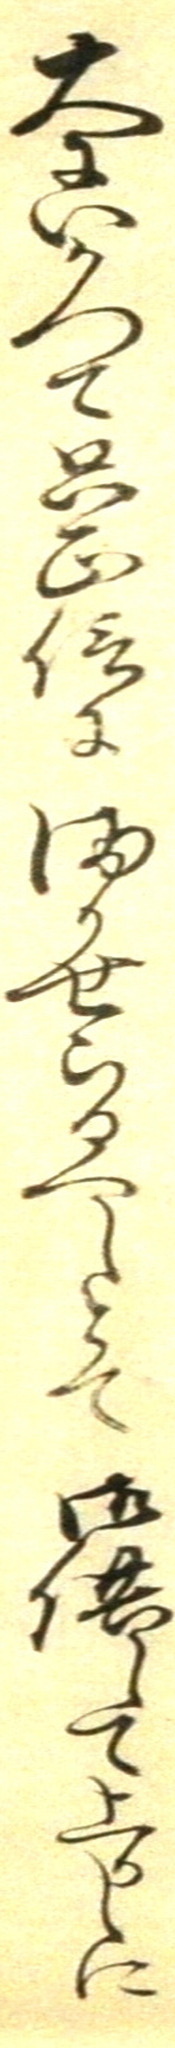大にいかつて只正信にまかせらるへしとて御供して上りしに
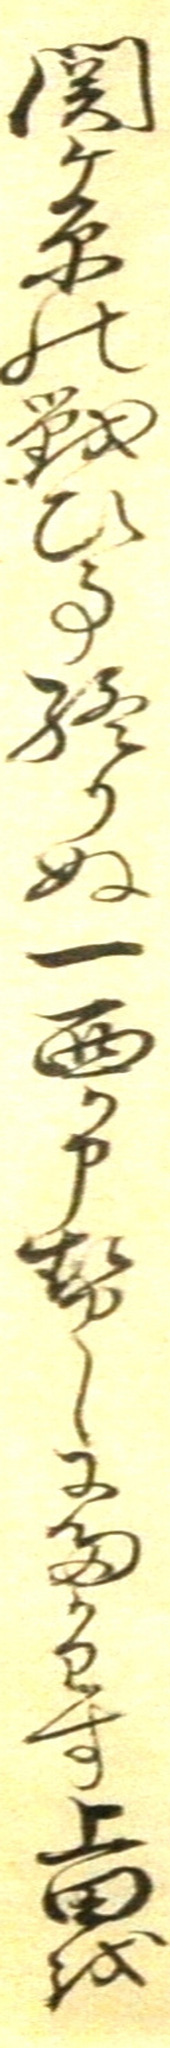関ヶ原の戦ひ事終りぬ一西か申せしにたかわす上田を
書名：藩翰譜（四・下）
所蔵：伊那市立高遠町図書館・合同会社AMANE
